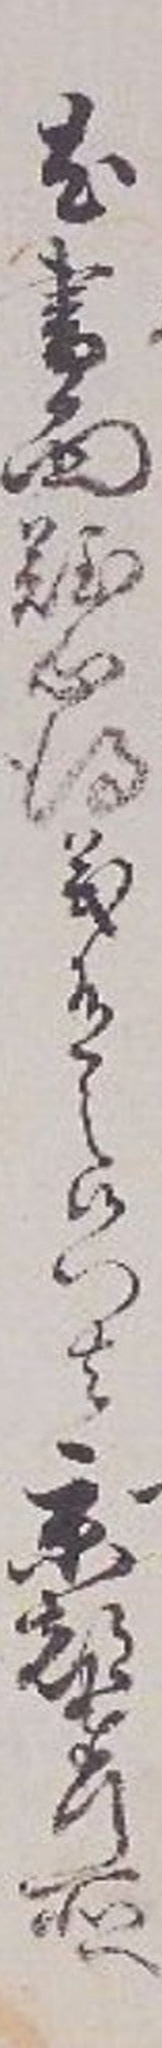尤書面難心得義有之候ハ者京都奉行所へ
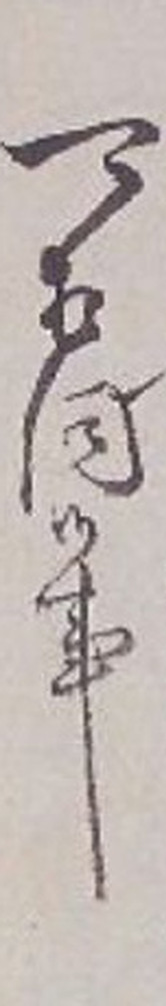可相伺候事
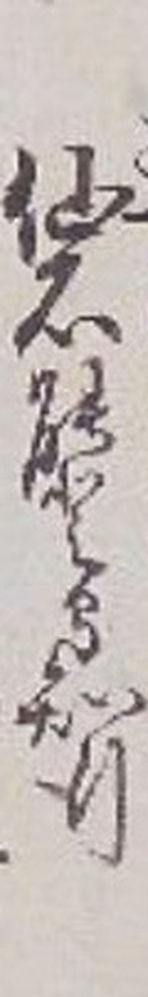仙石能登守知行
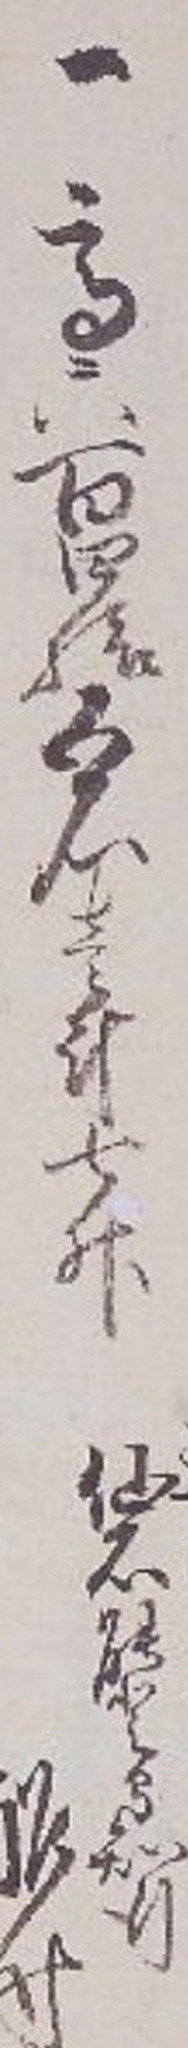一高六百四拾五石壱斗七升近江国浅井郡
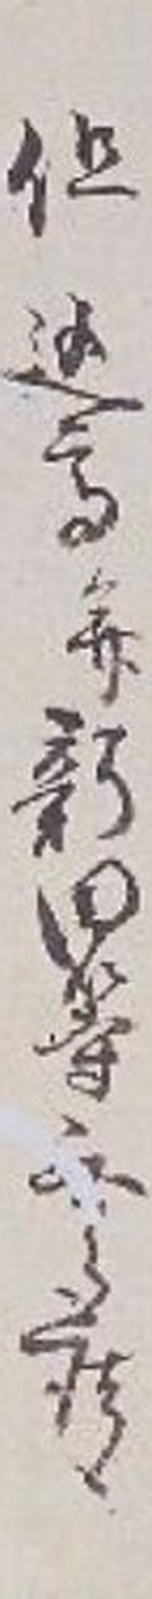但込高幷新田等無御座候
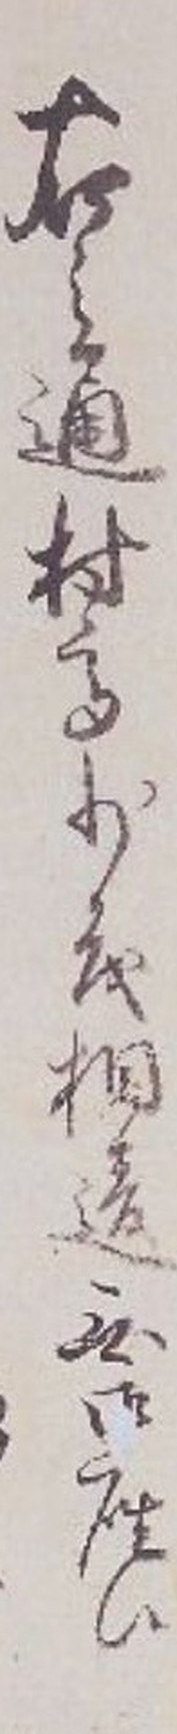右之通村高少も相違無御座候
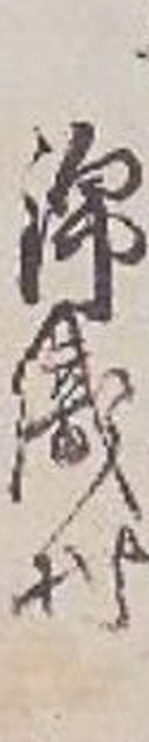錦織村
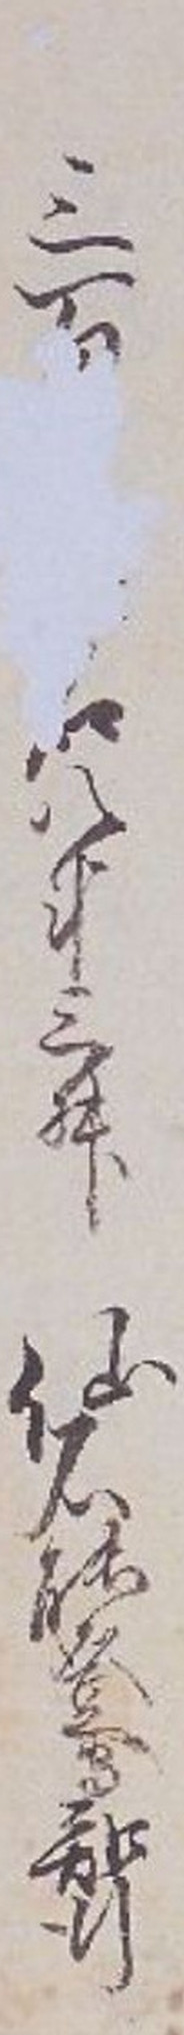三百石八斗三升仙石能登守知行
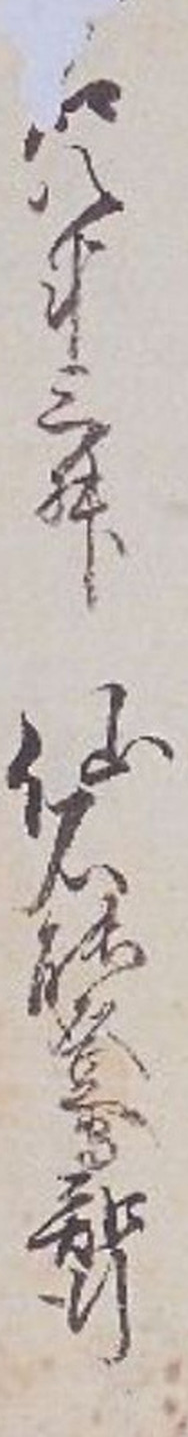三百石八斗三升仙石能登守知行
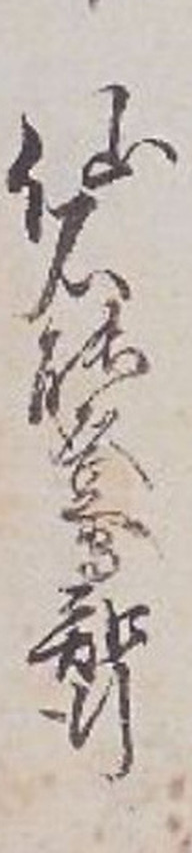仙石能登守知行

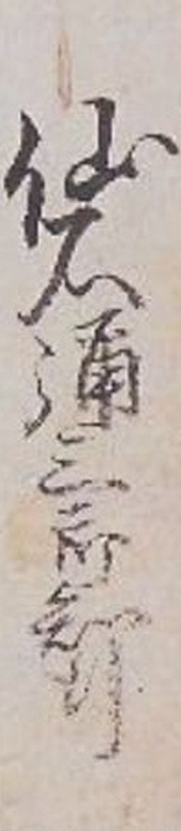仙石弥三郎知行
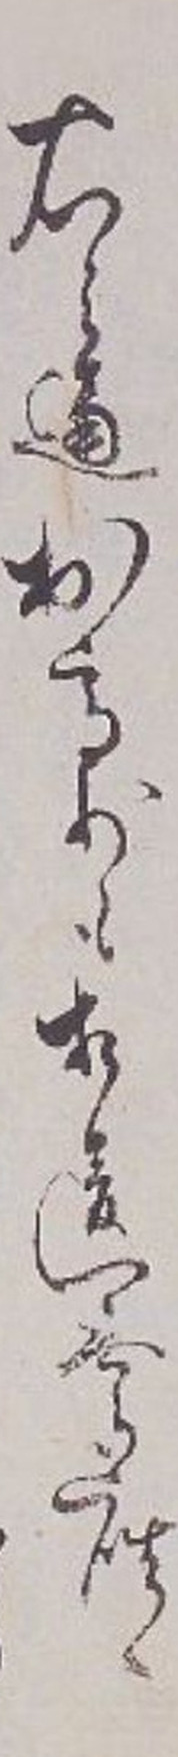右之通村高少も相違無御座候
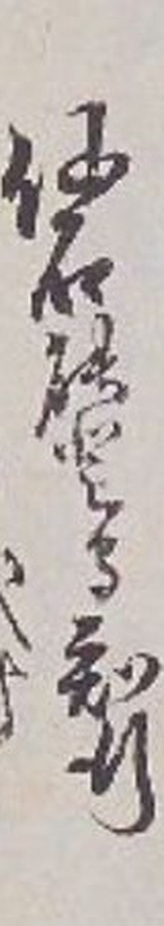仙石能登守知行
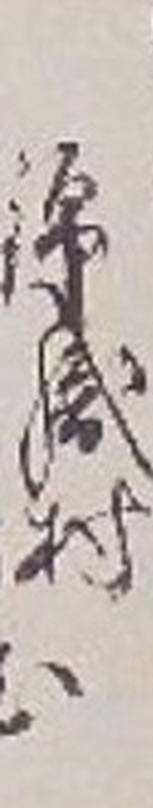錦織村
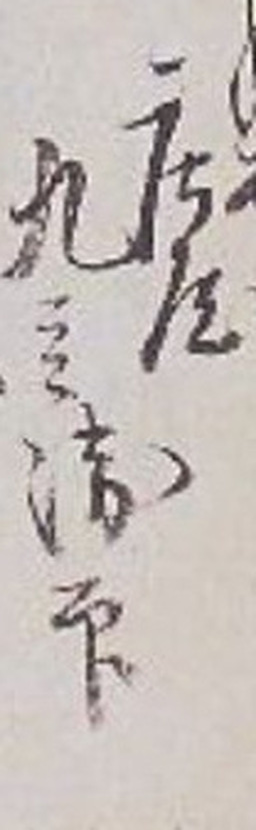九兵衛印
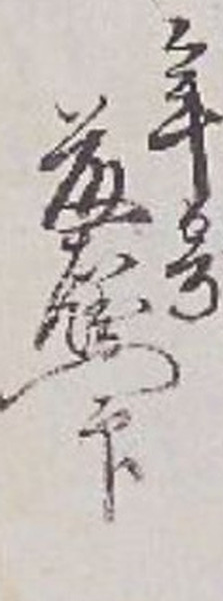藤左衛門印
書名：琉球人帰国に付国役金の記録
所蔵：University of the Ryukyus Library
